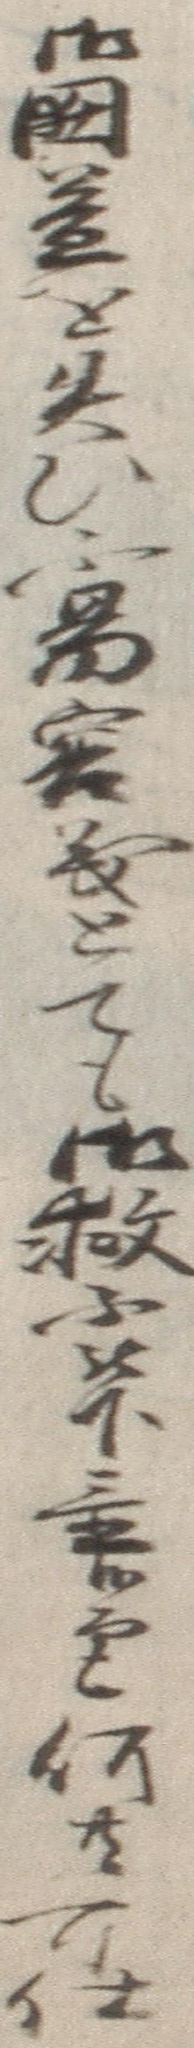御国益を失ひ不易容義とても御救不被下置候而は何共可仕
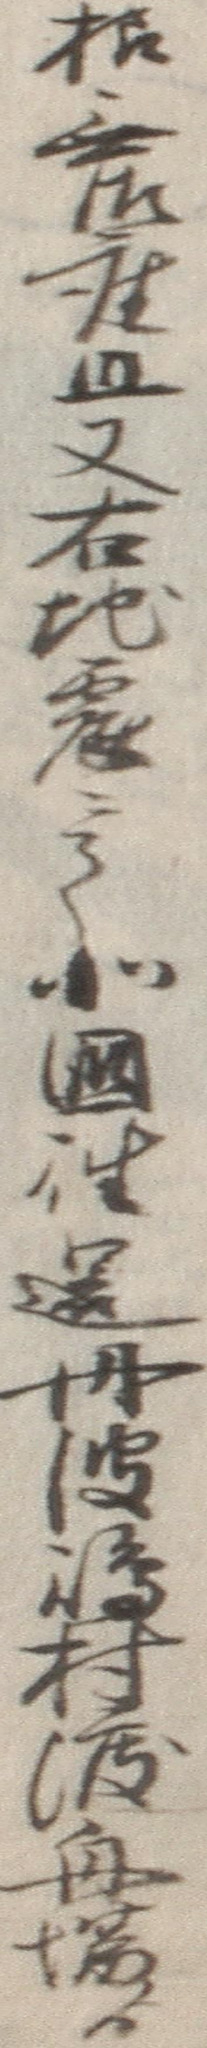様無御座且又右地震ニて北国往還丹波嶋村渡舟場ゟ
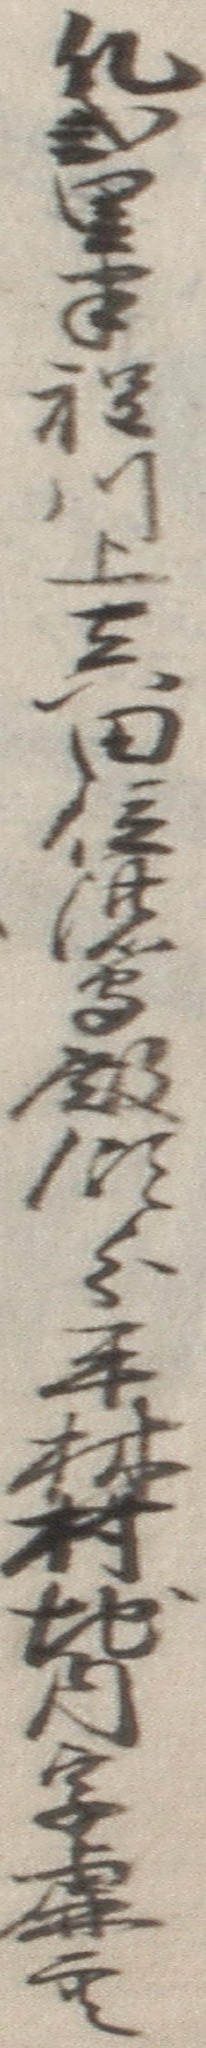凡弐里半程川上真田信濃守殿領分平林村地内字虚空
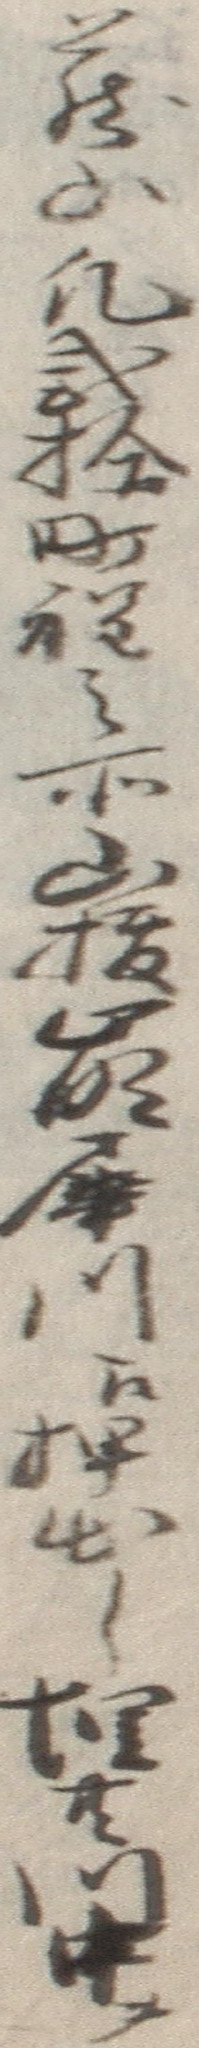蔵山凡弐拾町程之所山抜崩犀川え押出し埋共川中ヲ
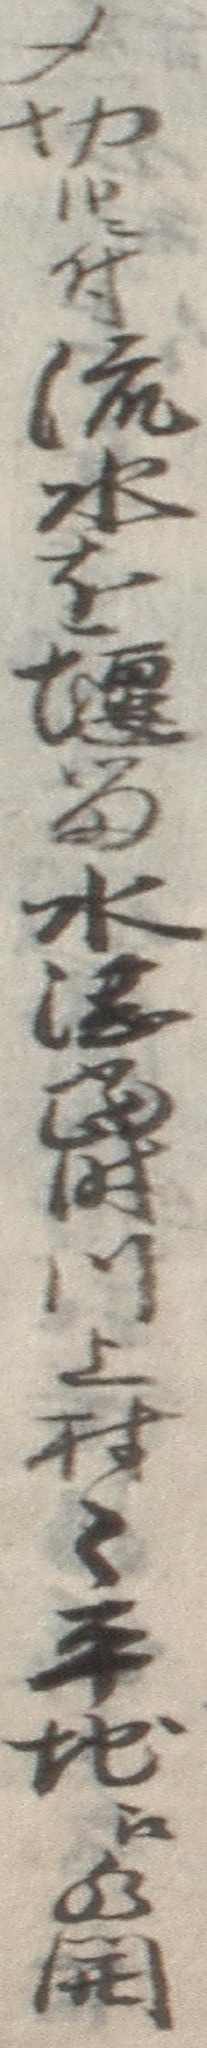〆切候ニ付流木を堰留え水湛当時川上村々平地え水開
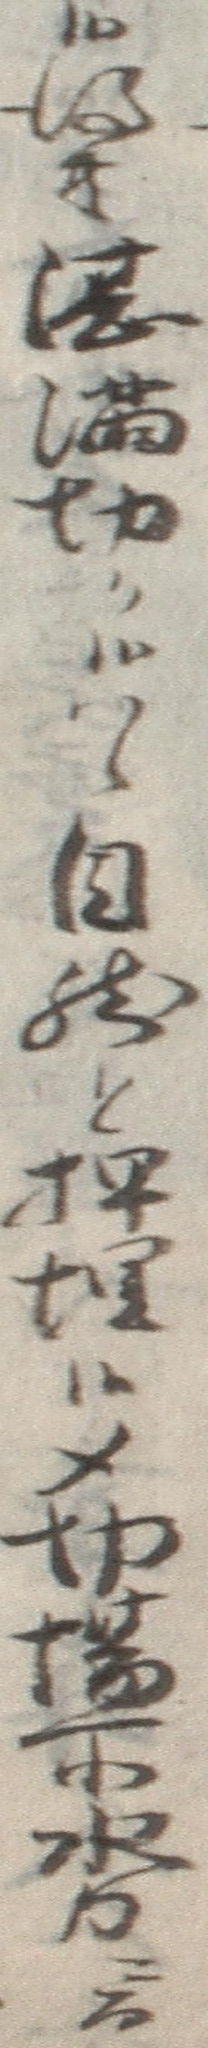候得共湛満切候ハゝ自然と押埋候〆切場所水力ニ而
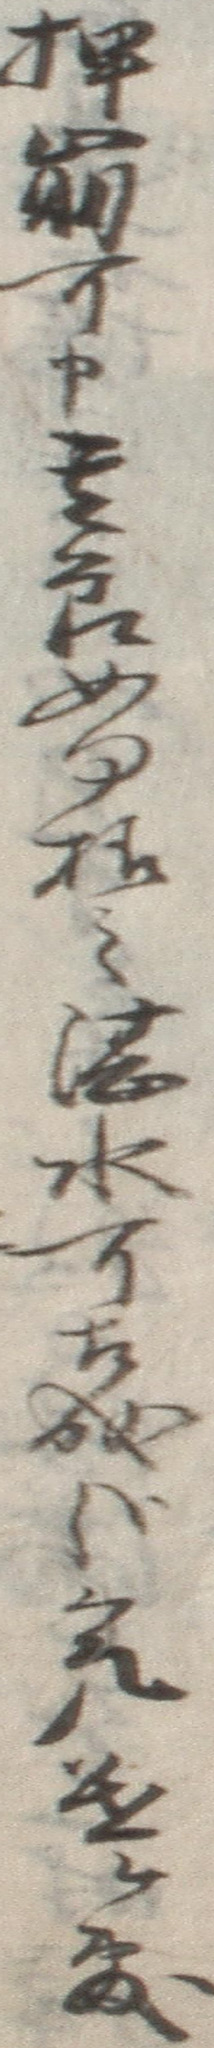押崩可申其節如何様之湛水可相成哉気遣ケ敷
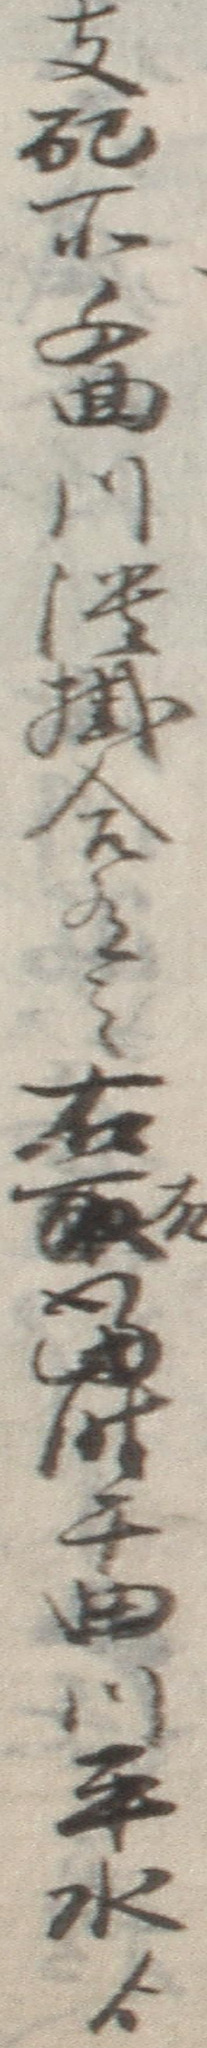支配所千曲川潰掛合有之右故当時千曲川平水ゟ

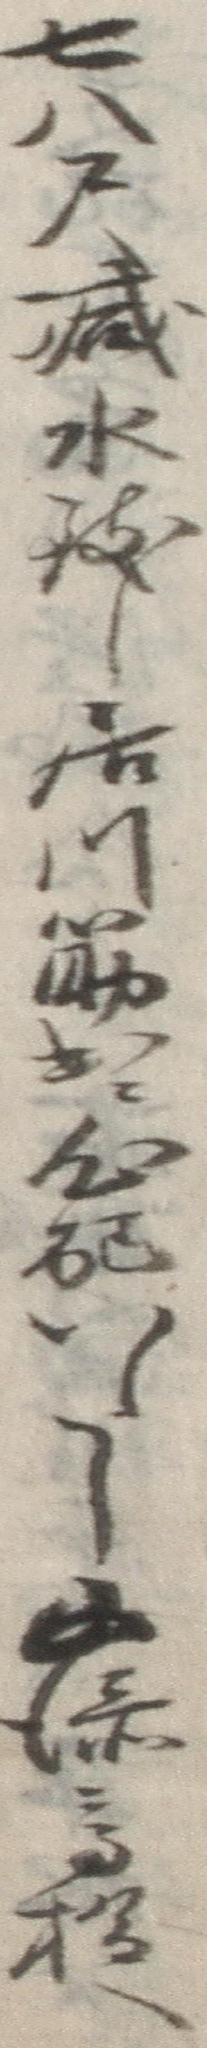七八尺減水致し居川筋出ニ心配いたし山添高場へ
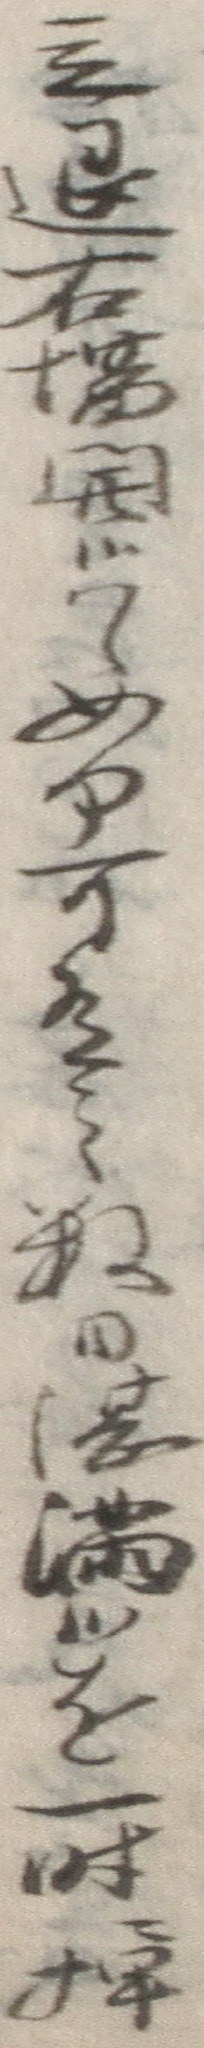立退右場開候ハゝ如何可有之数日湛満候を一時二押
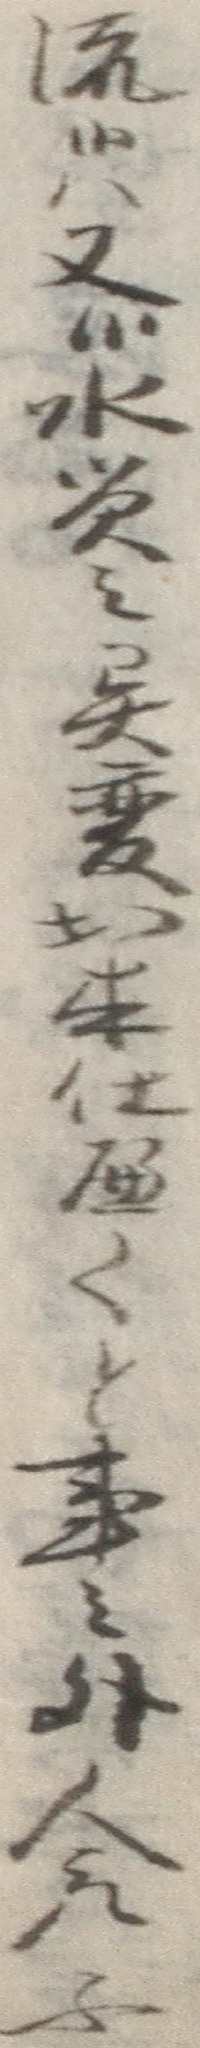流候ハ又候水災之異変出来仕べくと事之外人凡不
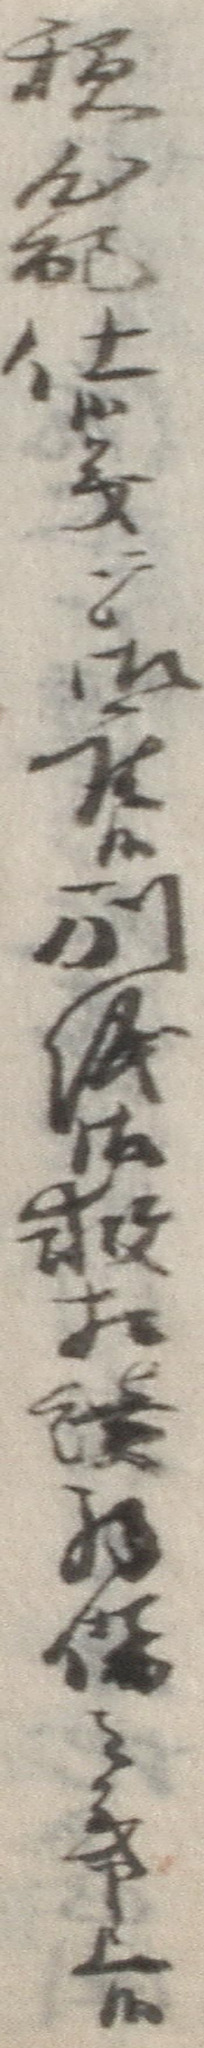穏心配仕候義にも御座候別紙御救相続拝借の義申上候
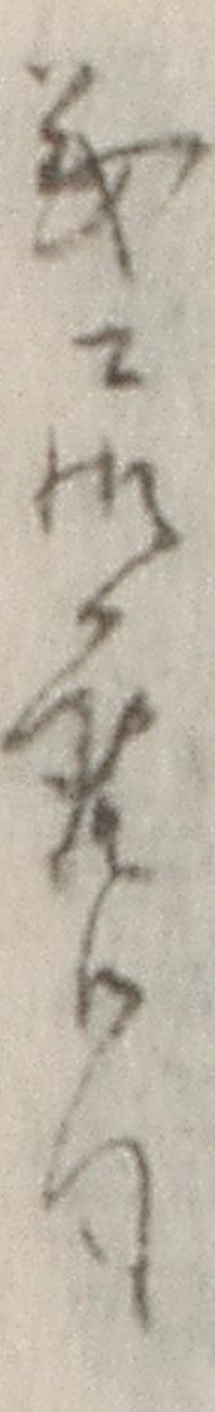義ニ御座候以上
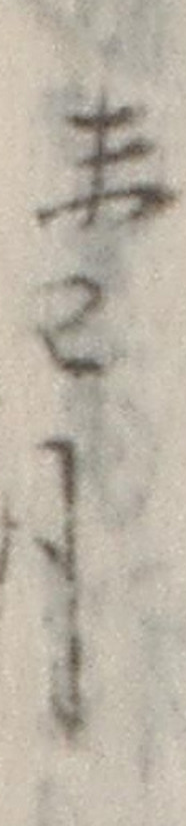未四月

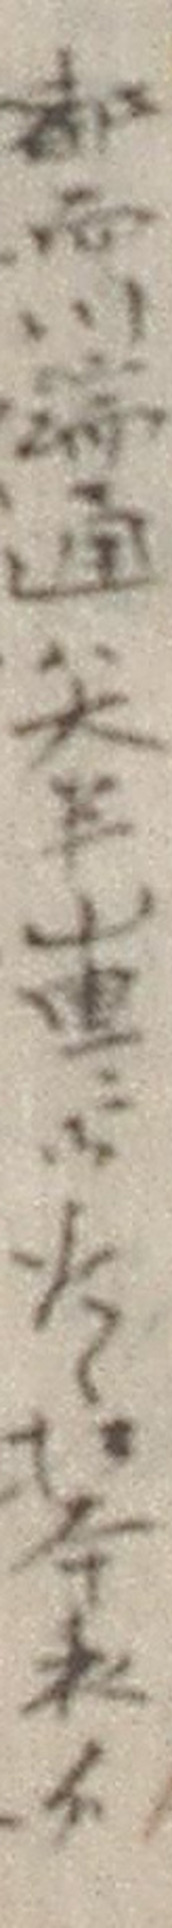都而川端通ハ大半山里二御坐候松本松平
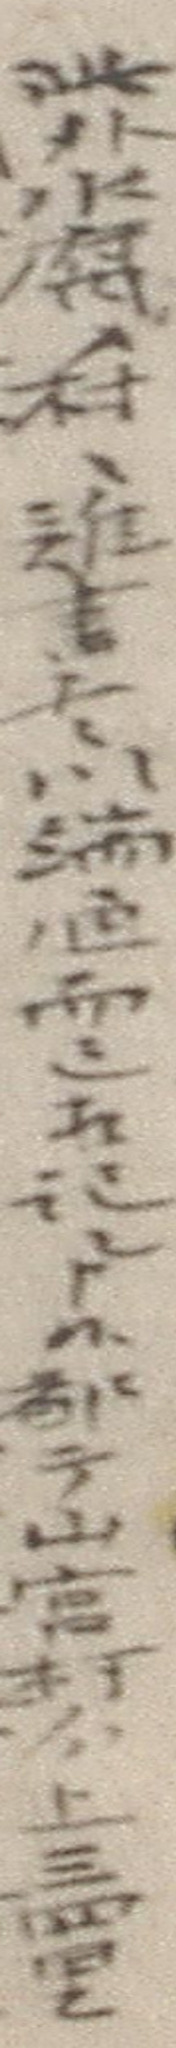此外水腐ノ村々難書其川端通而相記シ申候都テ山宮村ゟ上三四里
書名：[善光寺地震に関する冊子]
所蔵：東京大学地震研究所図書室 Earthquake Research Institute Library, The University of Tokyo, JAPAN
